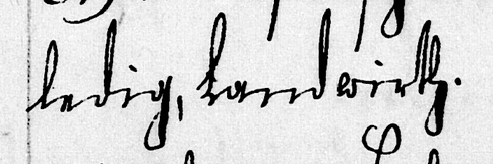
ledig, Landwirth.
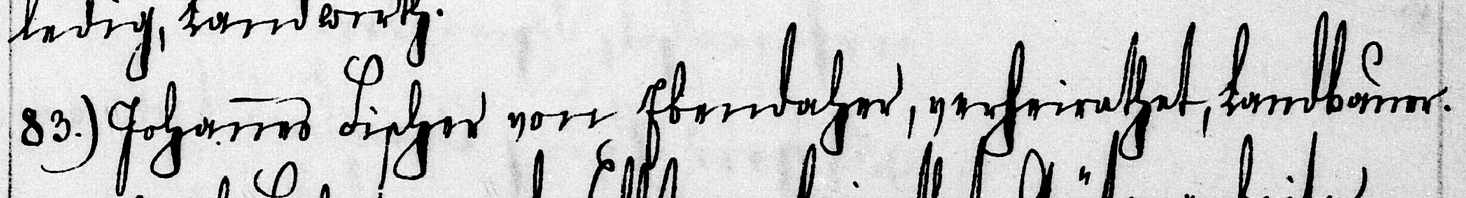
83.) Johannes Fischer von Ebendaher, verheirathet, Landbauer.
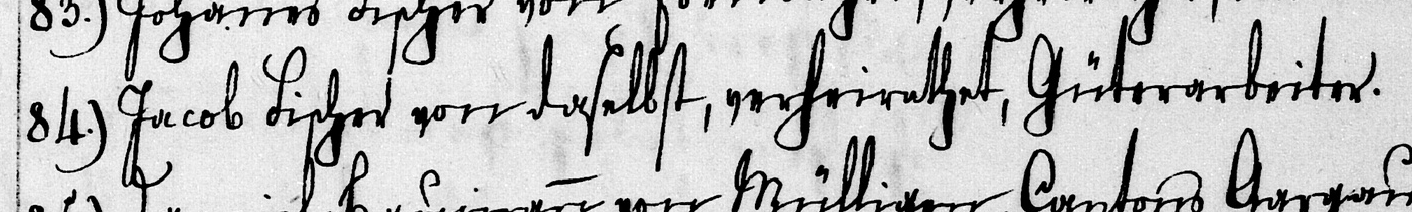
84.) Jacob Fischer von daselbst, verheirathet, Güterarbeiter.
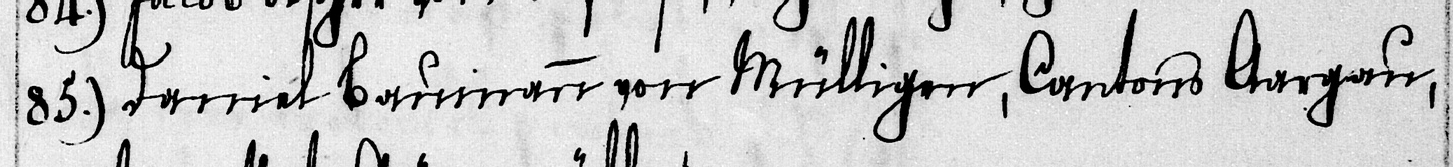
85.) Daniel Baumann von Mülligen, Cantons Aargau,
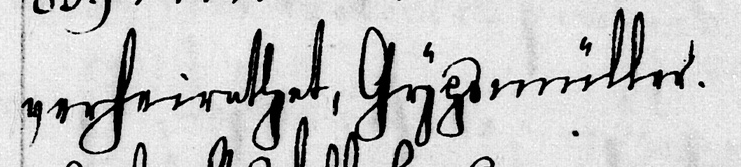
verheirathet, Gypsmüller.
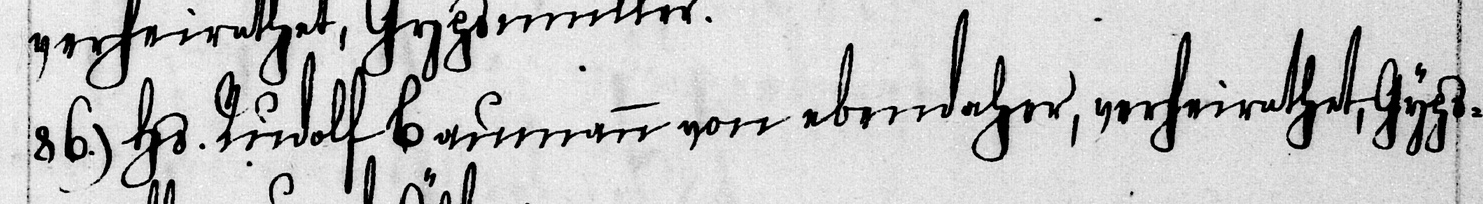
86.) Hs. Rudolf Baumann von ebendaher, verheirathet, Gyp¬
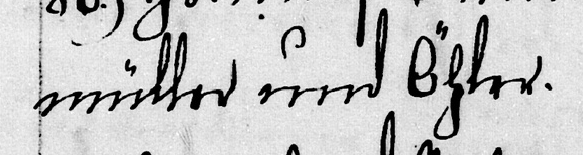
smüller und Öhler.
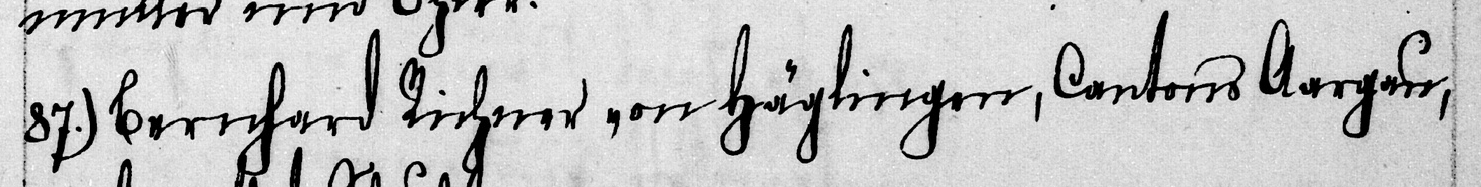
87.) Bernhard Richner von Häglingen, Cantons Aargau,
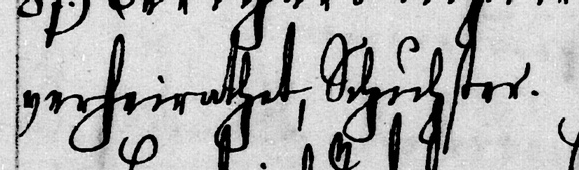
verheirathet, Schuhster.
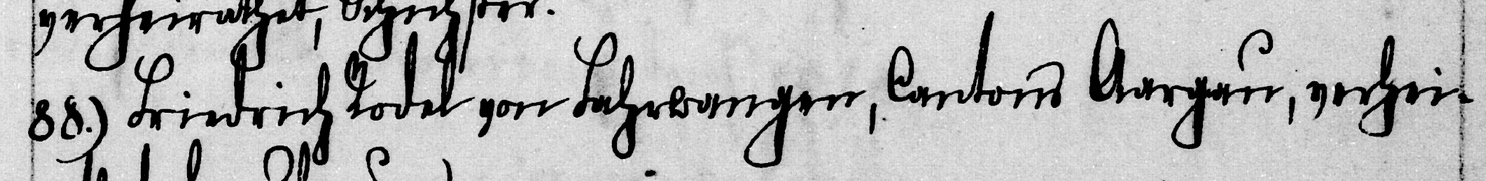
88.) Friedrich Rodel von Fahrwangen, Cantons Aargau, verhei¬
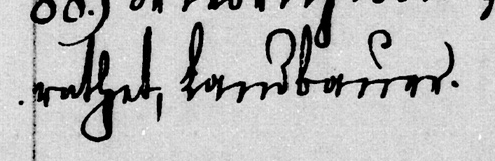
rathet, Landbauer.
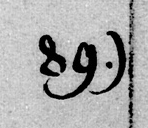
79.)
